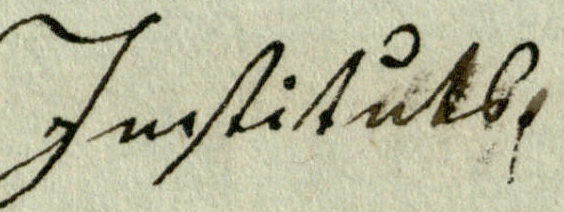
Instituts
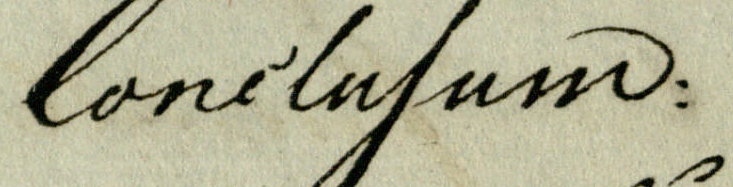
Conclusum:
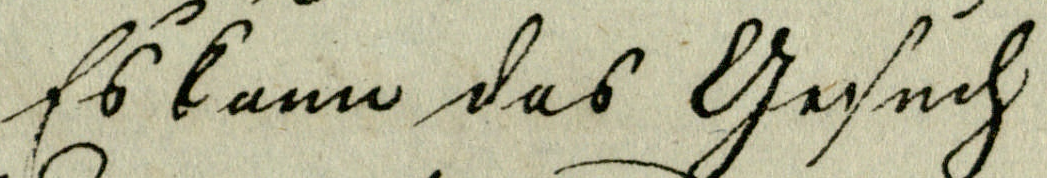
Es kann das Gesuch
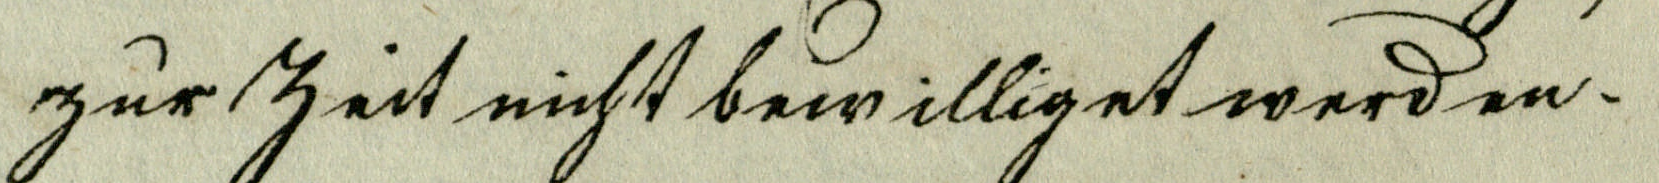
zur Zeit nicht bewilliget werden.
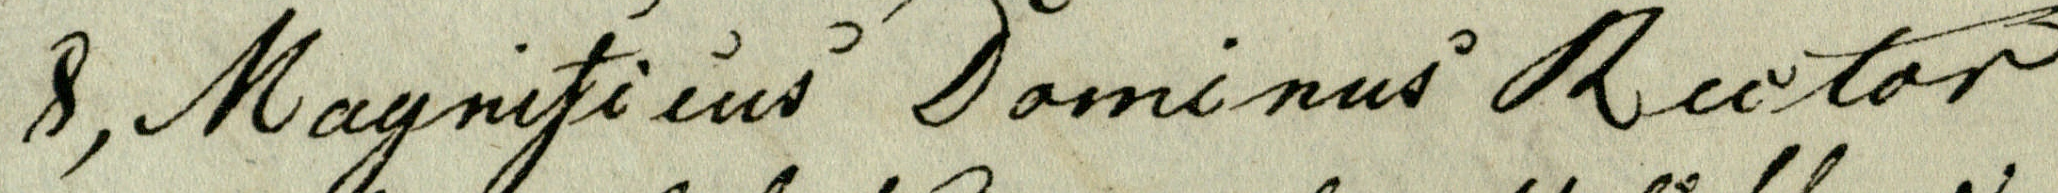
8, Magnificus Dominus Rector
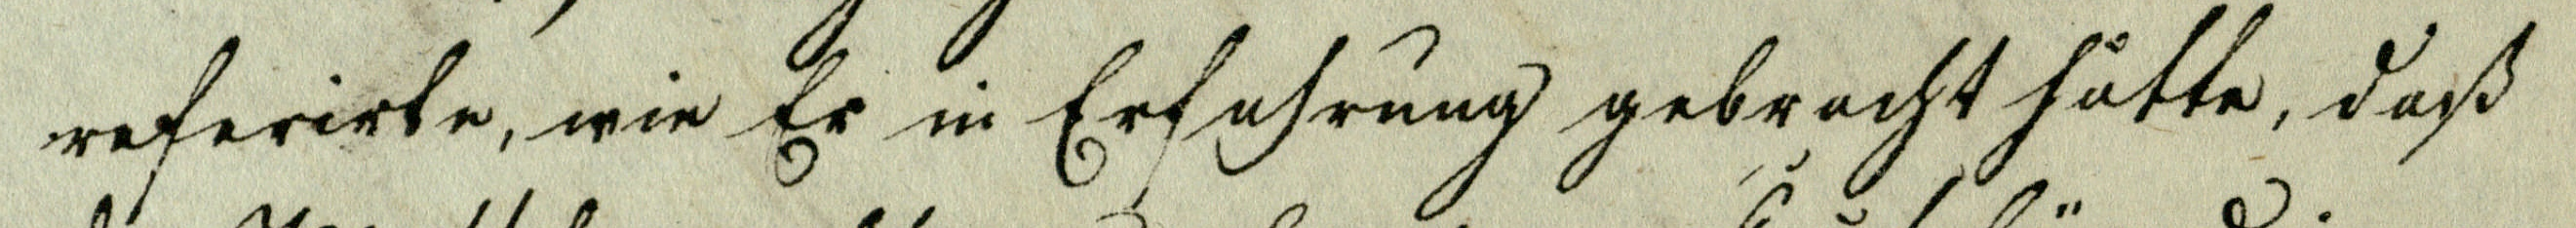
referirte, wie Er in Erfahrung gebracht hätte, daß
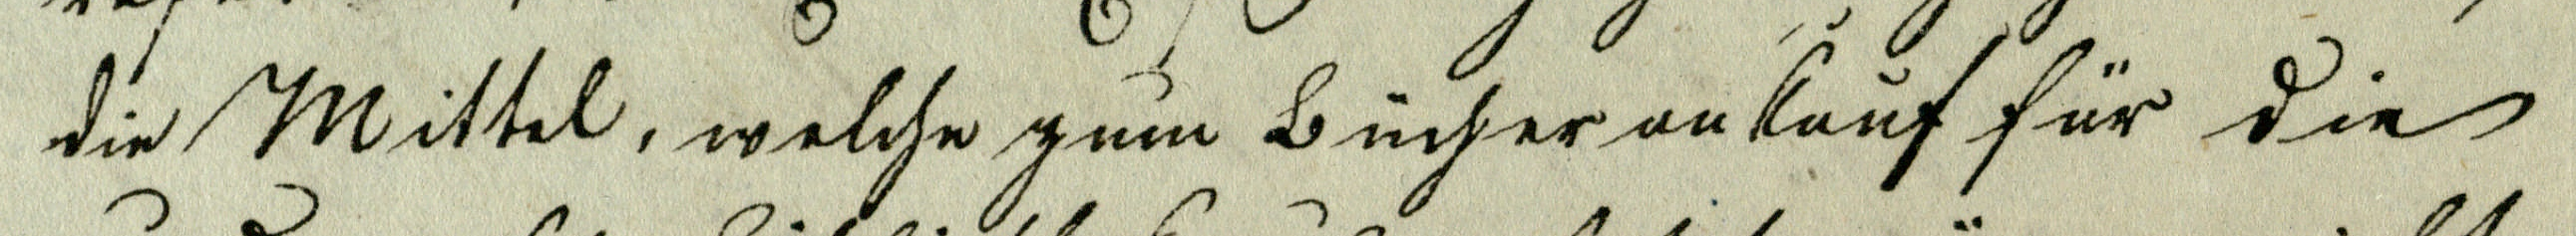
die Mittel, welche zum Bücherankauf für die
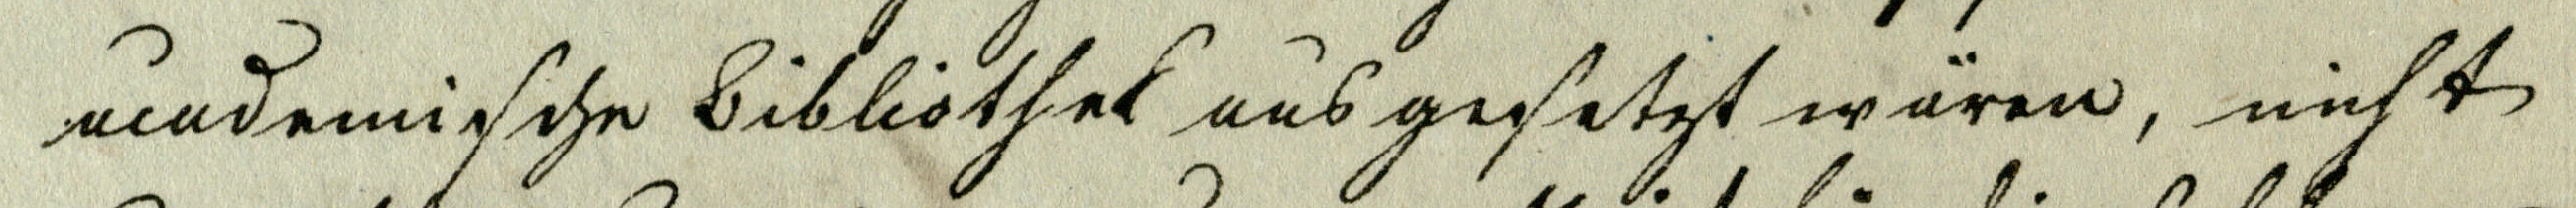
academische Bibliothek ausgesetzt wären, nicht
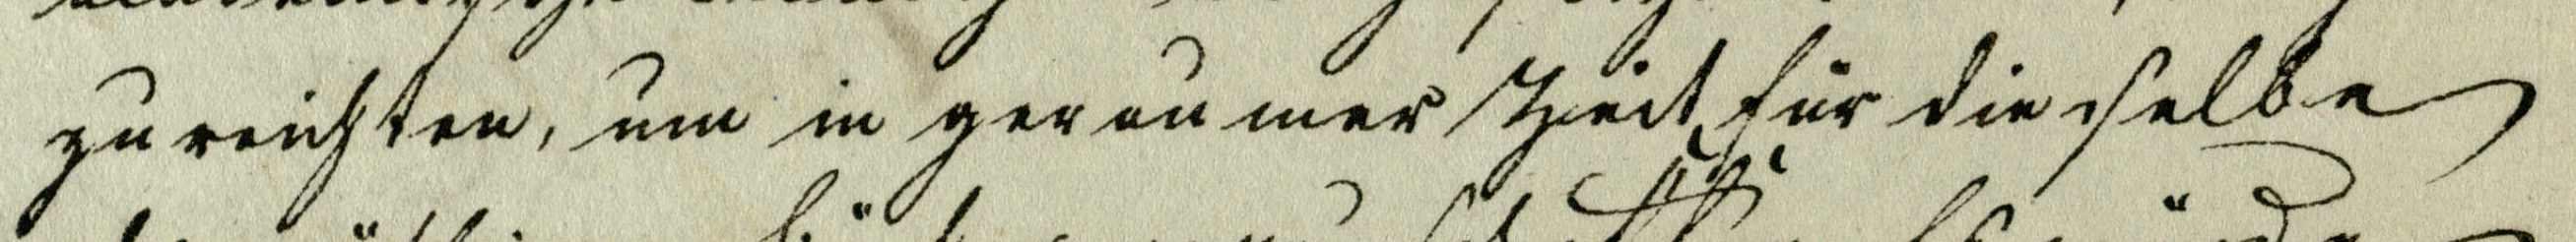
zureichten, um in geraumer Zeit für dieselbe
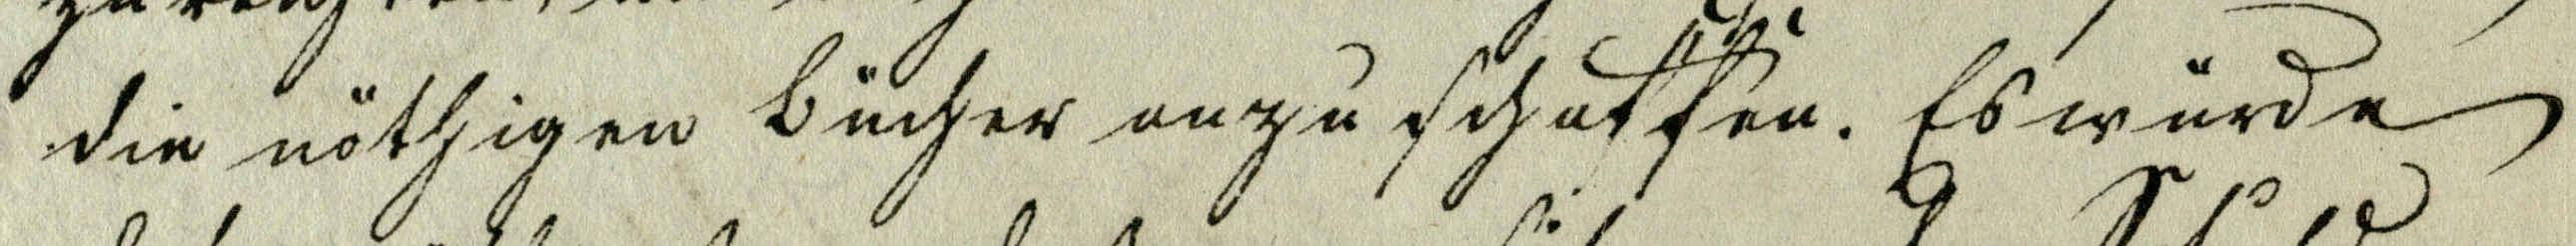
die nöthigen Bücher anzuschaffen. Es würde
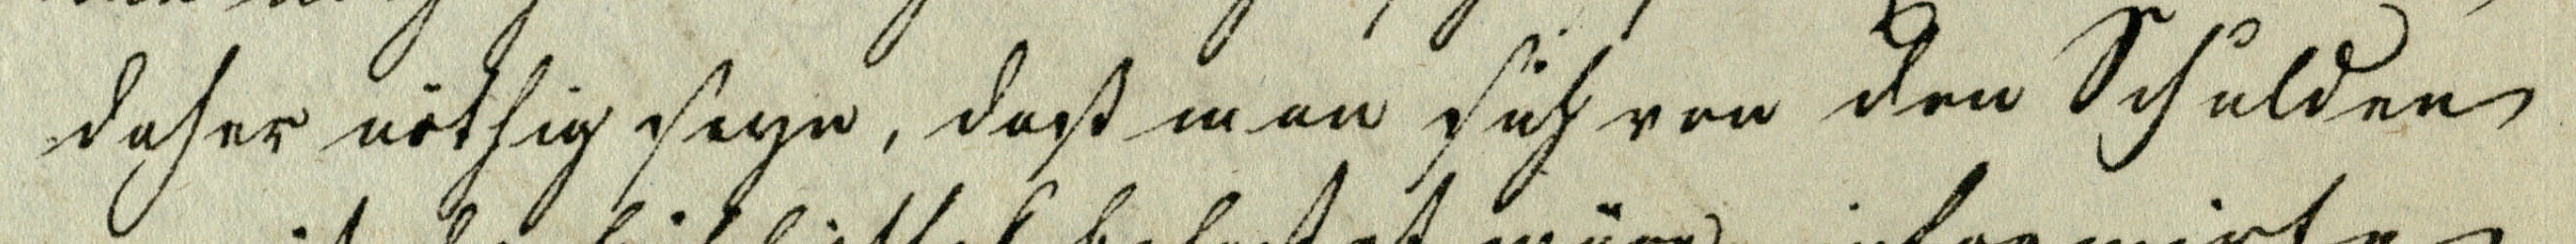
daher nöthig seyn, daß man sich von den Schulden
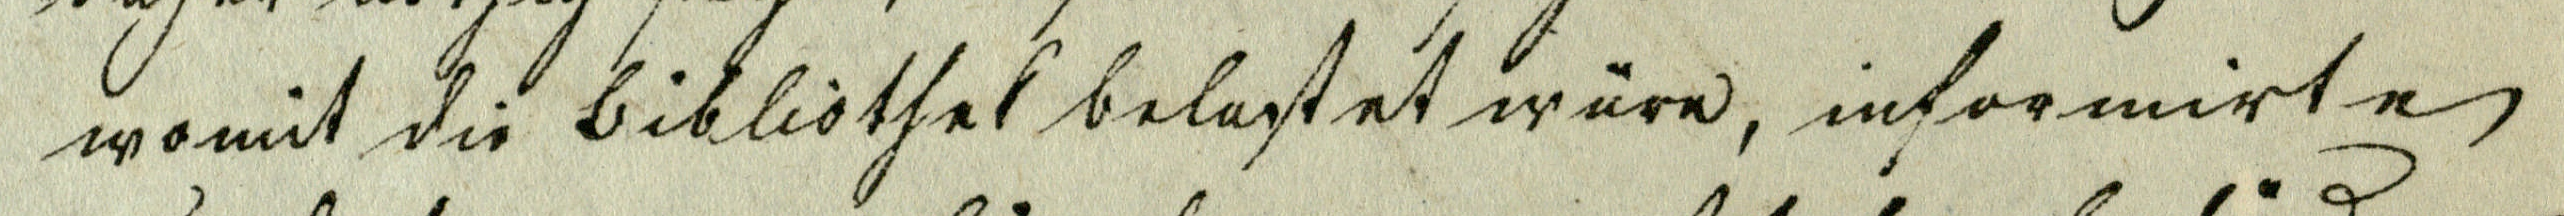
womit die Bibliothek belastet wäre, informirte
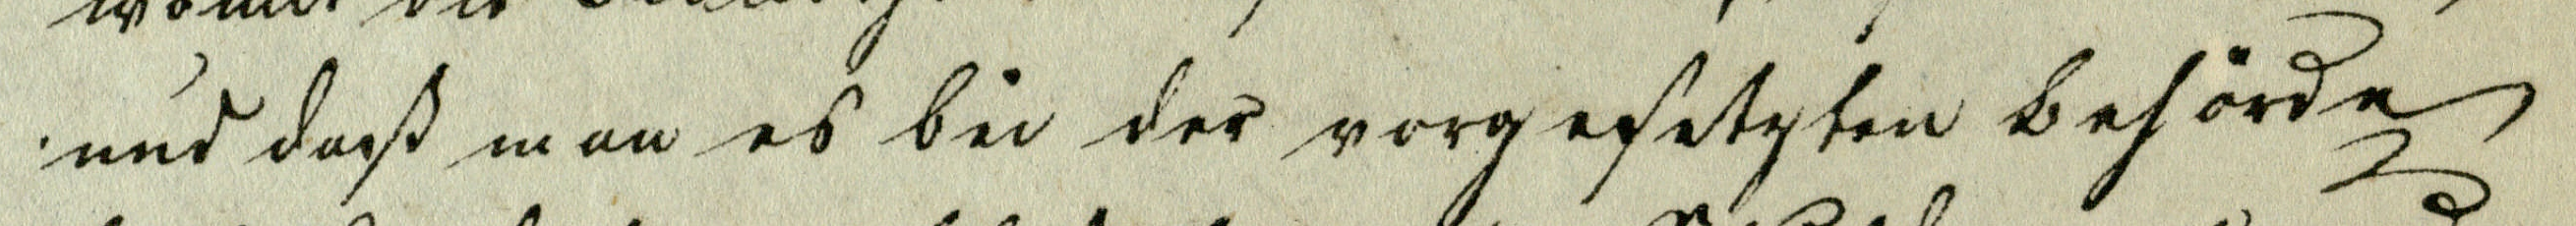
und daß man es bei der vorgesetzten Behörde
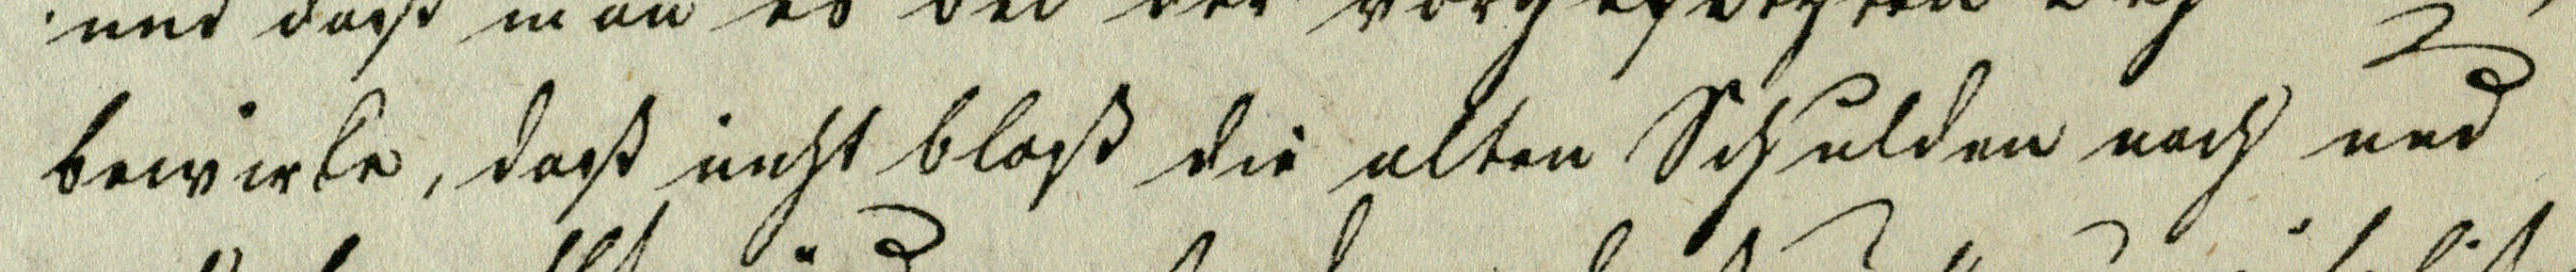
bewirke, daß nicht bloß die alten Schulden nach und
